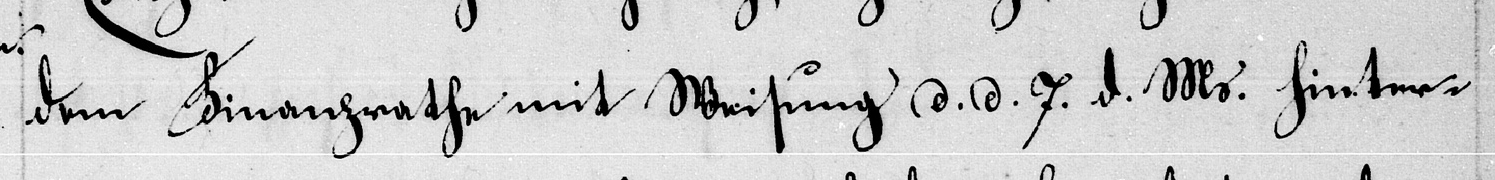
dem Finanzrathe mit Weisung d. d. 7. d. Ms. hinter¬
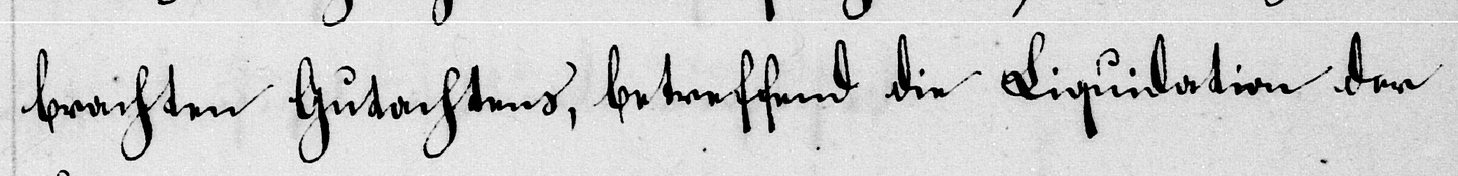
brachten Gutachtens, betreffend die Liquidation der
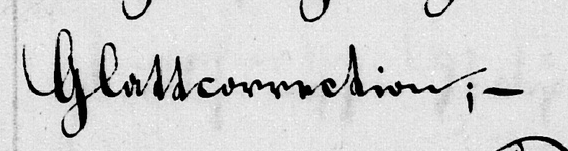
Glattcorrection; –
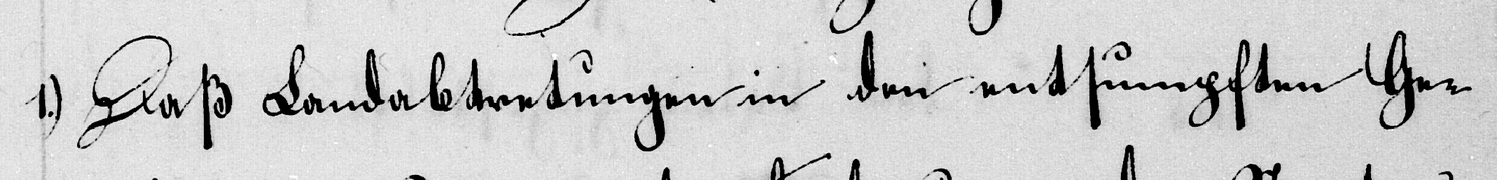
1.) Daß Landabtretungen in den entsumpften Ge¬
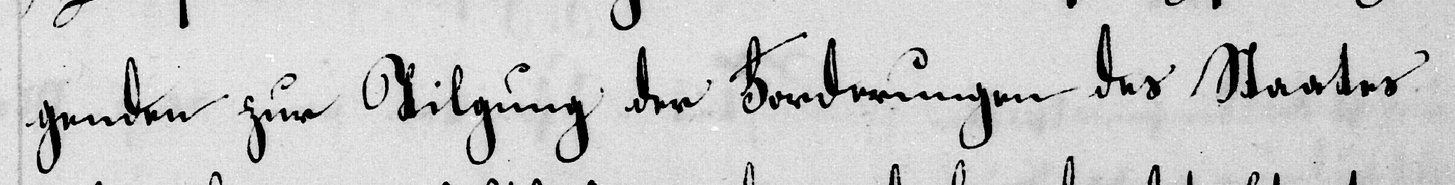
genden zur Tilgung der Forderungen des Staates
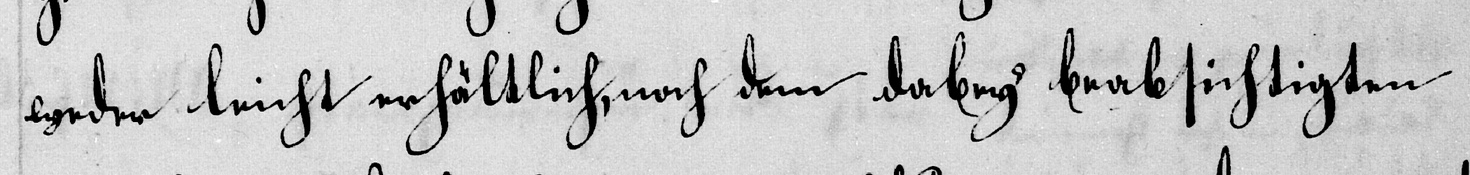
weder leicht erhältlich, noch dem dabey beabsichtigten
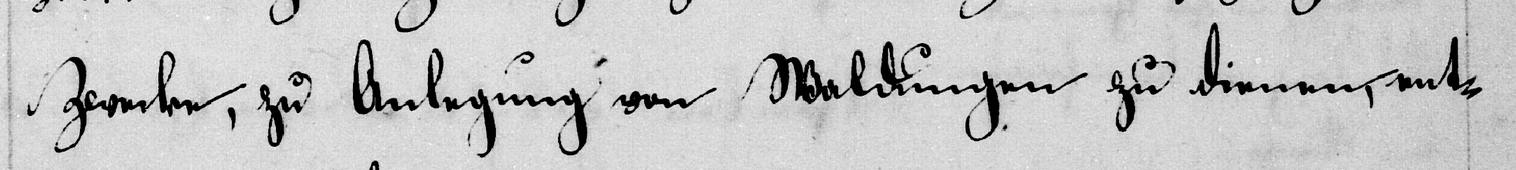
Zwecke, zu Anlegung von Waldungen zu dienen, ent¬
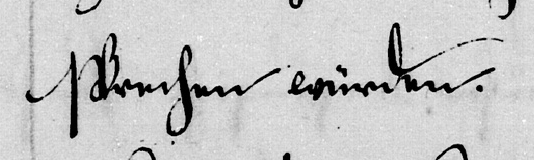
sprechen würden.
